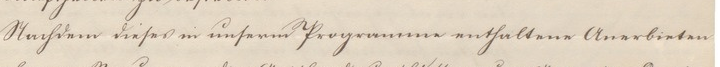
Nachdem dieses in unserm Programme enthaltenen Anerbieten
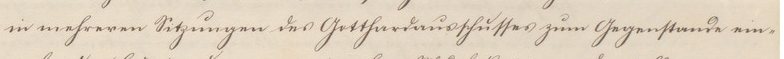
in mehreren Sitzungen des Gotthardausschusses zum Gegenstande ein-
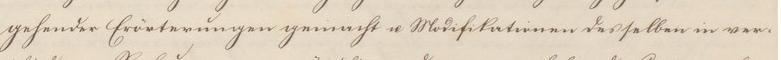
gehender Erörterungen gemacht & Modifikationen desselben in ver-
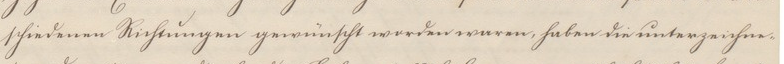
schiedenen Richtungen gewünscht worden waren, haben die unterzeichne-
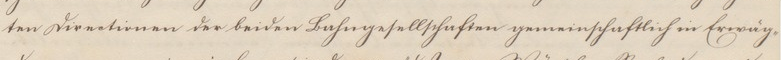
ten Directionen der beiden Bahngesellschaften gemeinschaftlich in Erwäg-
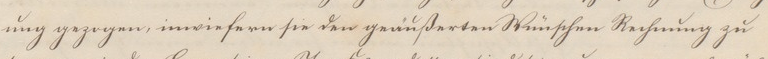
ung gezogen, inwiefern sei den geäußerten Wünschen Rechnung zu
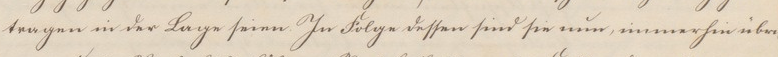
tragen in der Lage seien. In Folge dessen sind sie nun, immerhin übri-
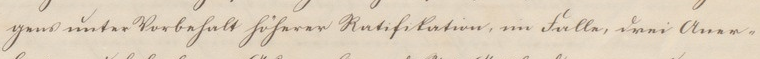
gens unter Vorbehalt höherer Ratifikation, im Falle, drei Aner-
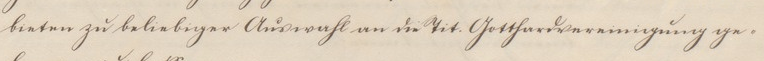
bieten zu beliebiger Auswahl an die Tit. Gotthardvereinigung ge-
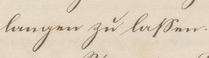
langen zu lassen.
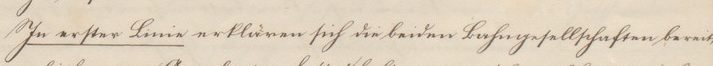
In erster Linie erklären sich die beiden Bahngesellschaften bereit,
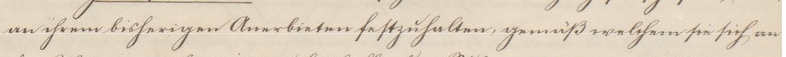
an ihrem bisherigen Anerbieten festzuhalten, gemäß welchem sie sich an
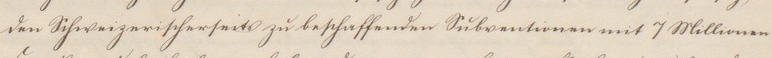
den Schweizerischerseits zu beschaffenden Subventionen mit 7 Millionen
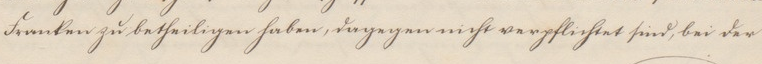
Franken zu betheiligen haben, dagegen nicht verpflichtet sind, bei der
